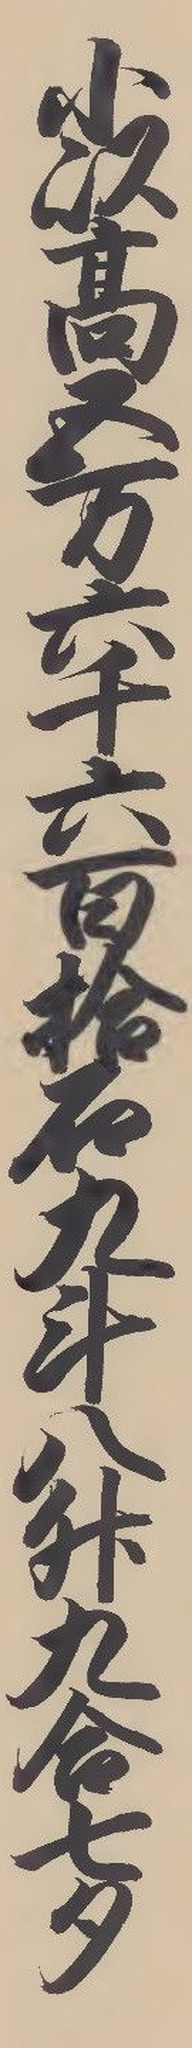小以高五万六千六百拾石九斗八升九合七勺
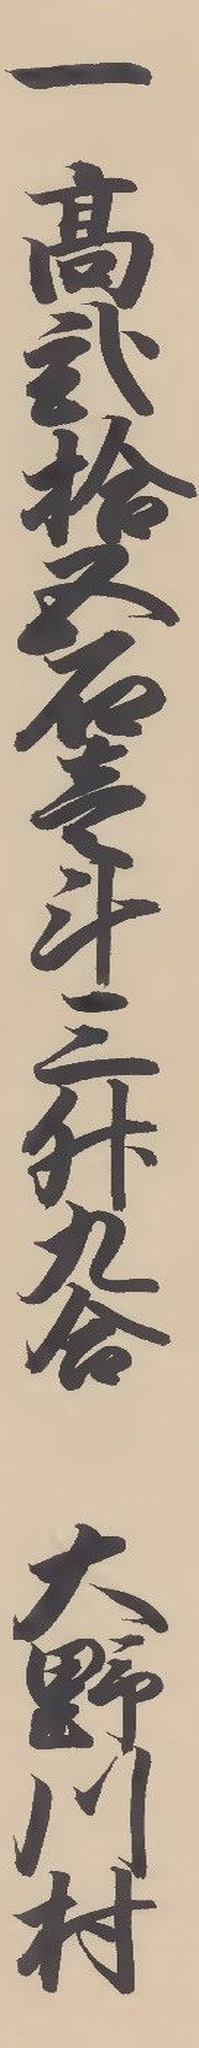一高弐拾五石壱斗三升九合大野川村
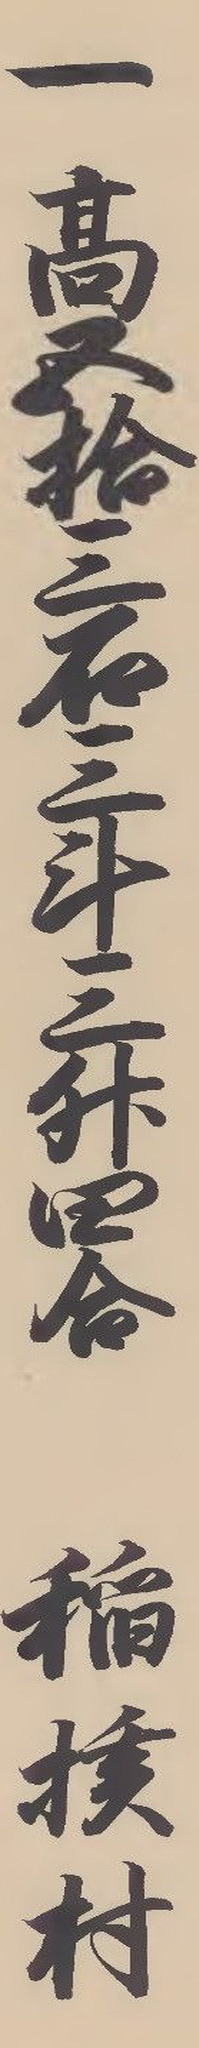一高五拾三石三斗三升四合稲核村
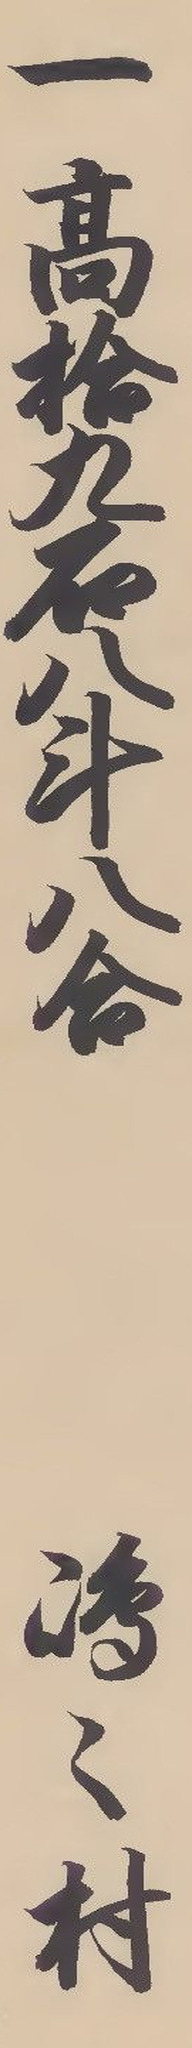一高拾九石八斗八合島々村

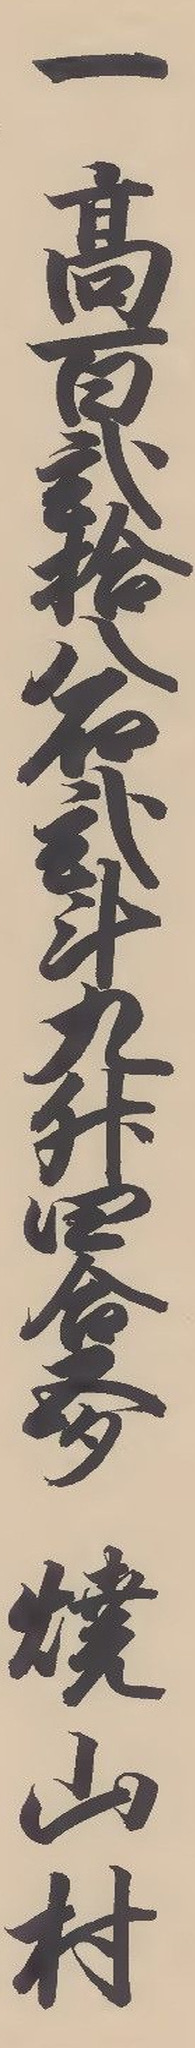一高百弐拾八名弐斗九升四合五勺焼山村
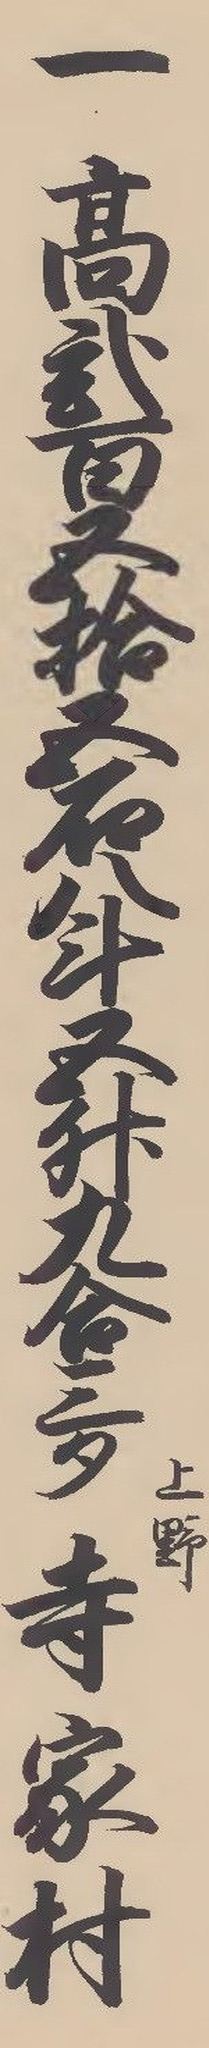一高弐五拾五石八斗五升九合三勺寺家村
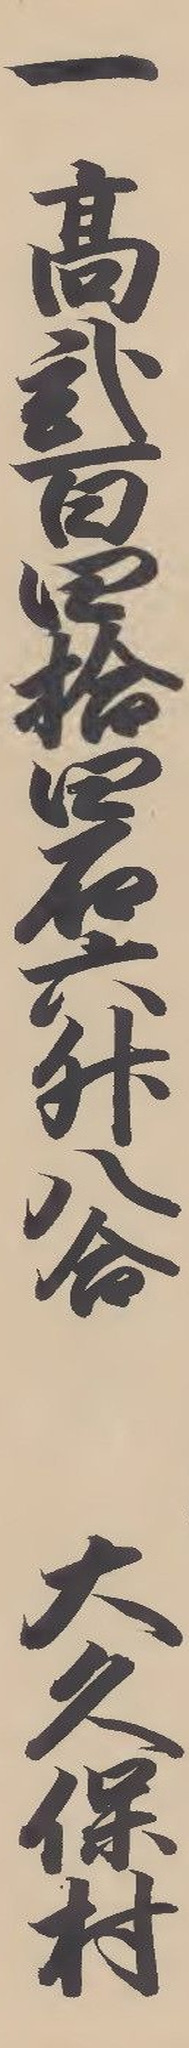一高弐百四拾四石六升八合大久保村
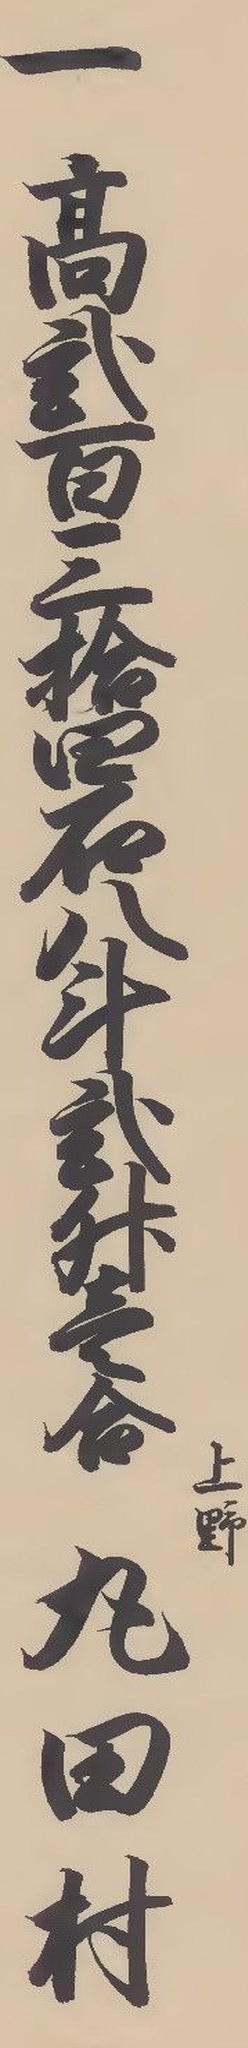一高弐百三拾四石八斗弐升壱合丸田村
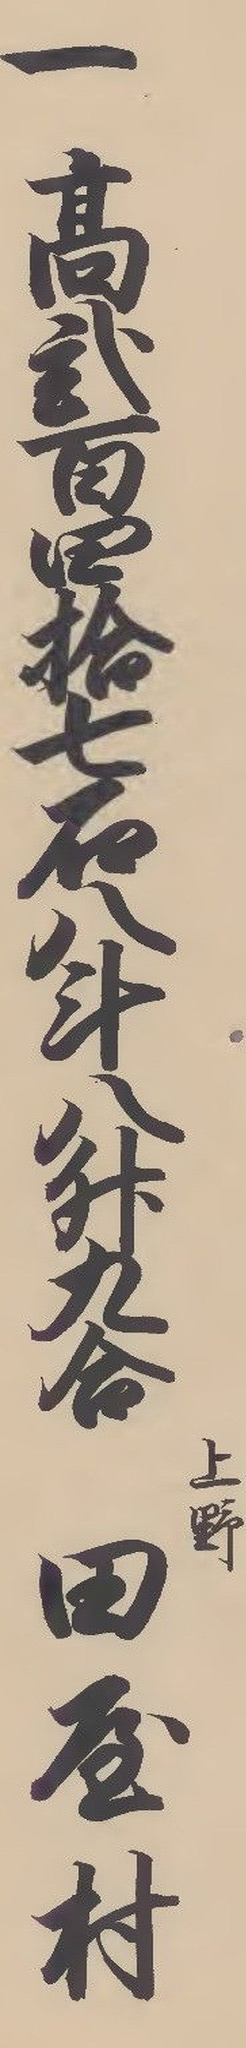一高弐百四拾七石八斗八升九合田屋村

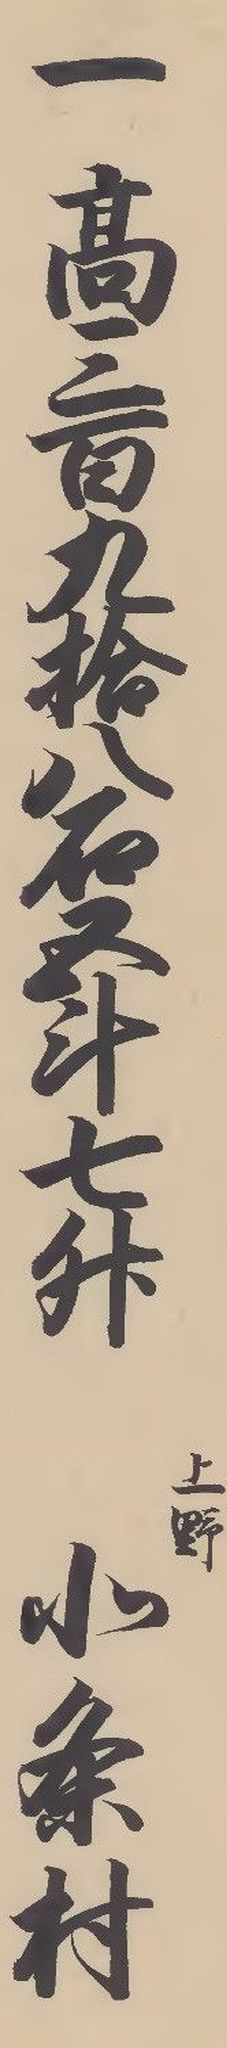一高三百九拾八石五斗七升北条村
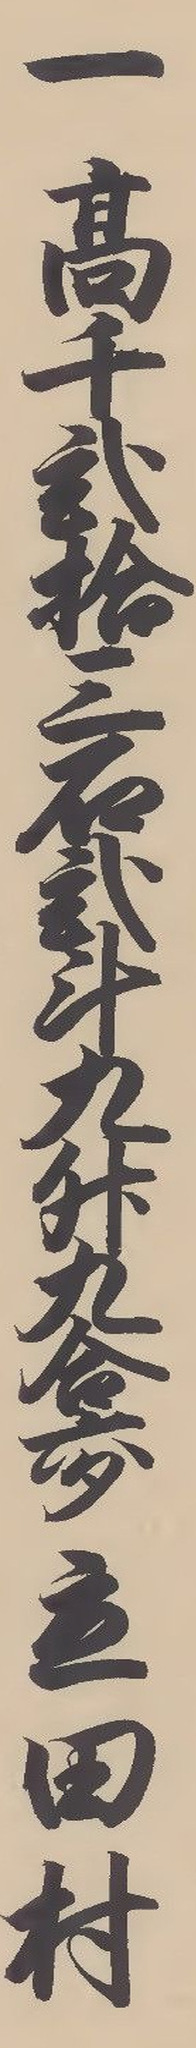一高千弐拾三石弐斗九升九合六勺立田村
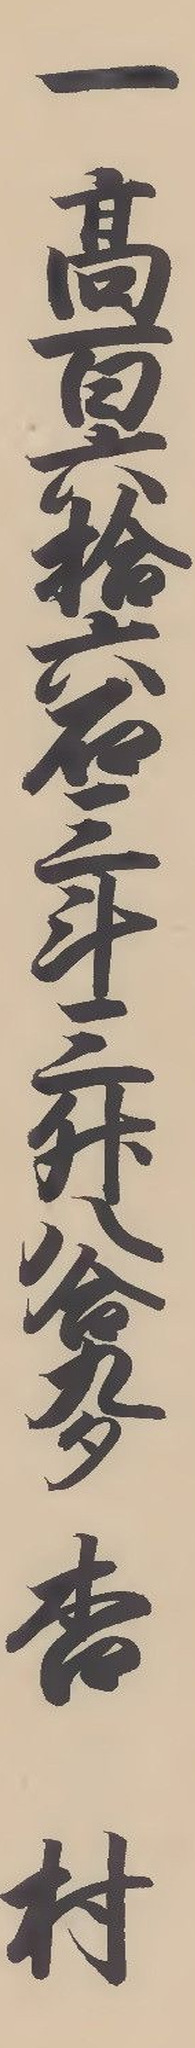一高百六拾六石三斗三升八合九勺杏村
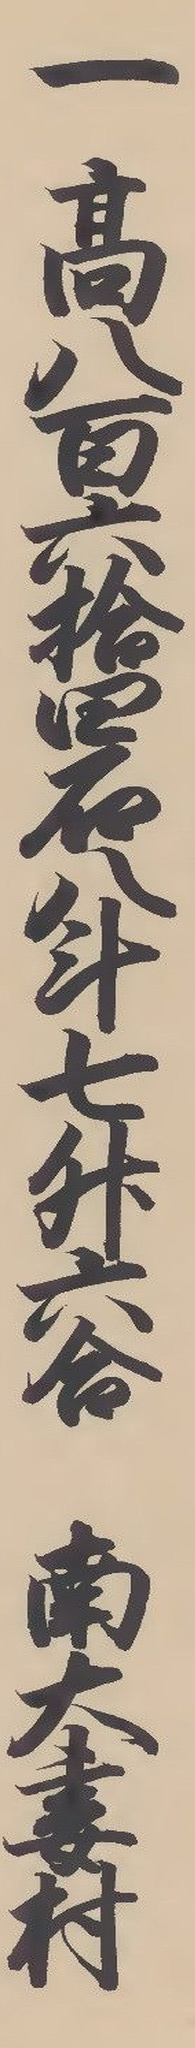一高八百六拾四石八斗七升六合南大妻村
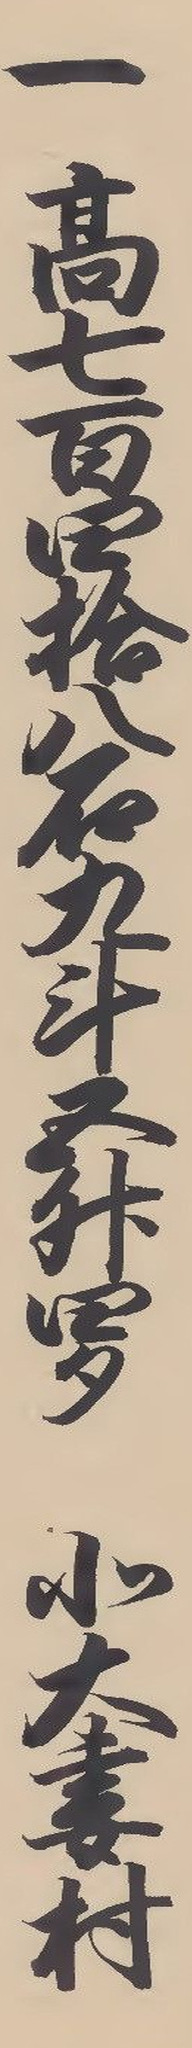一高七百四拾八石九斗五升四勺北大妻村
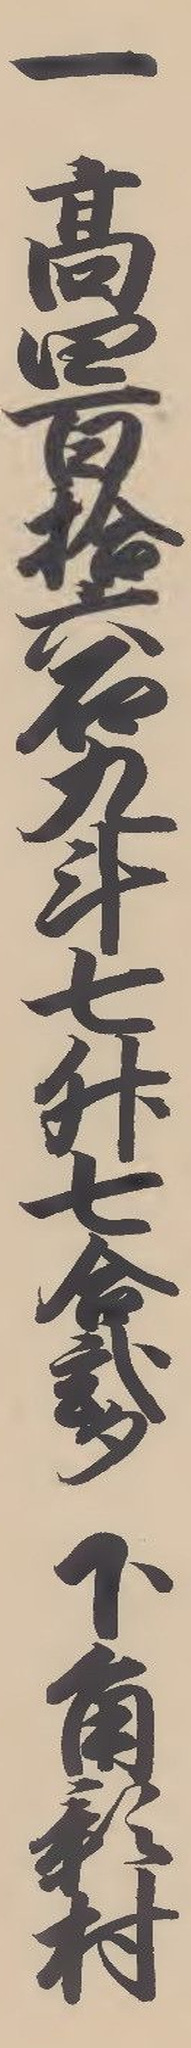一高四百拾六石九斗七升七合弐勺下角影村
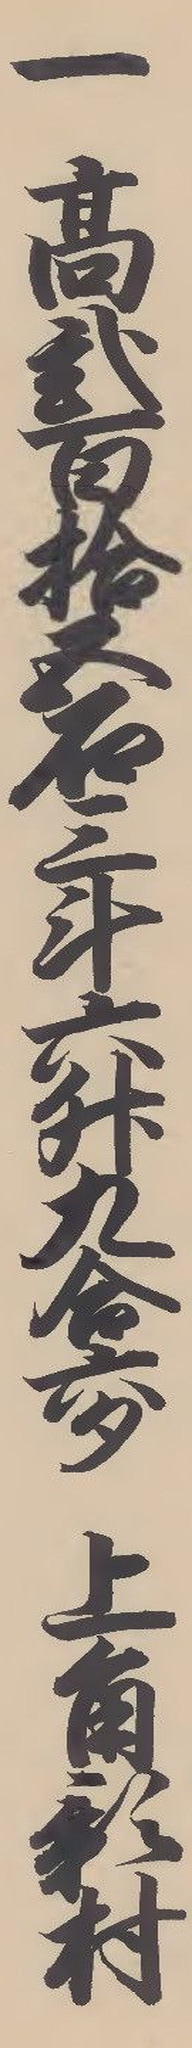一高弐百拾五石三斗六升九合六勺上角影村
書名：信濃国郷帳
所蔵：国立公文書館 National Archives of Japan
